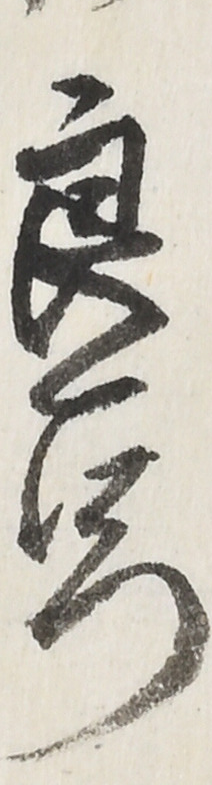作右衛門
